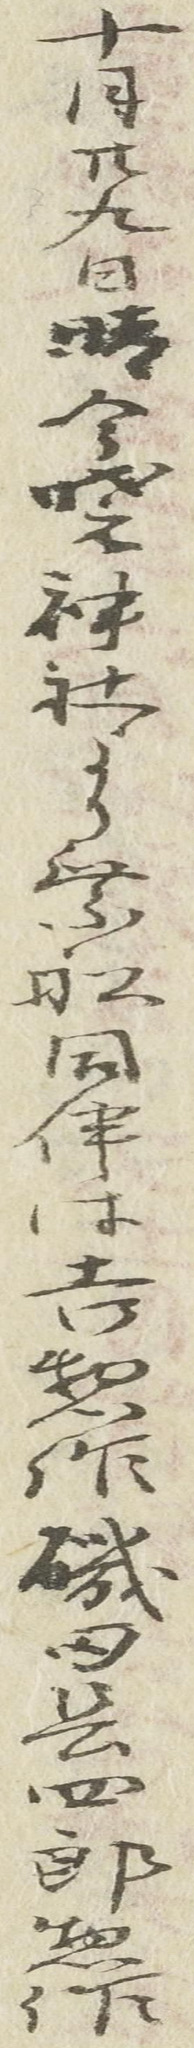十月廿九日晴今暁神社より乗船同伴は土口惣作磯田長四郎惣作
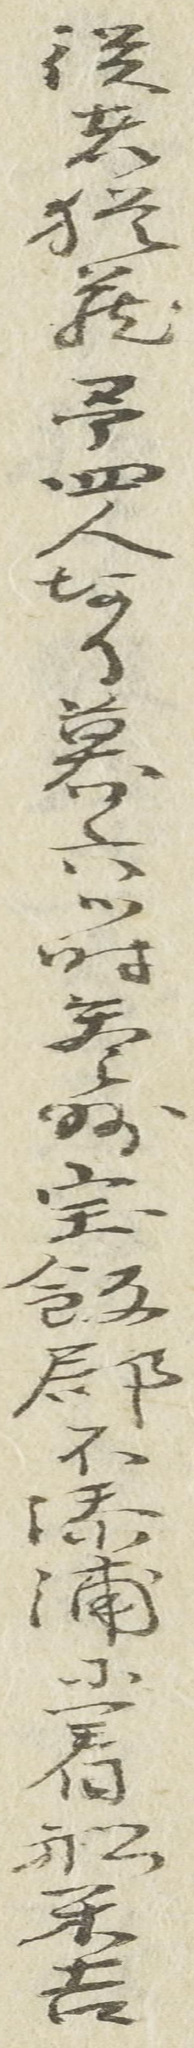従者猶蔵予四人なり暮六ツ時参州宝飯郡不添浦に着船米吉
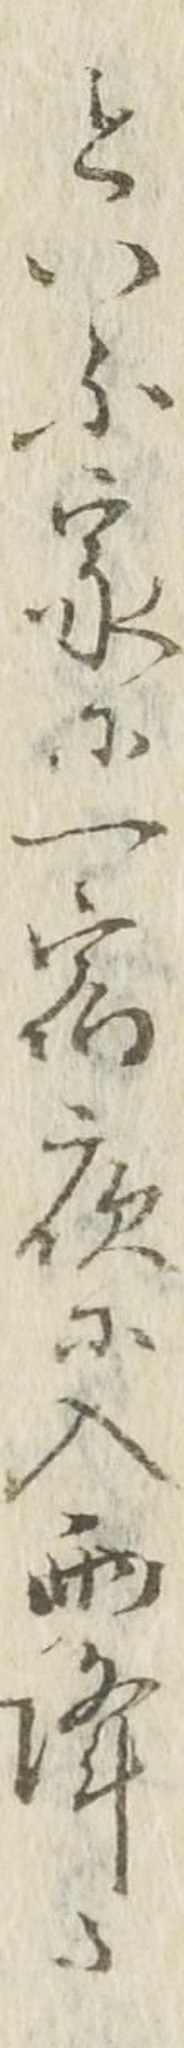といふ家に一宿夜に入雨降る
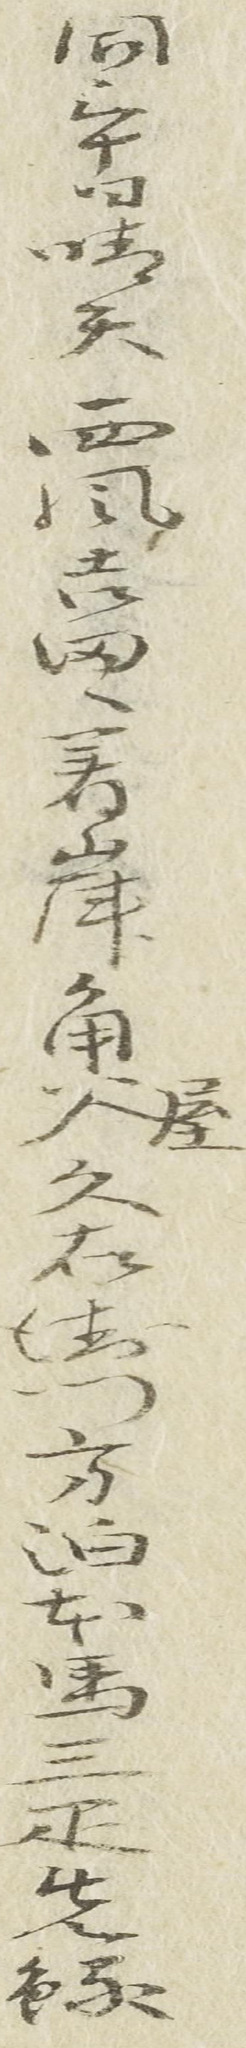同三十日晴天西風吉田へ着岸角屋久右衛門方泊本馬三疋先鰥
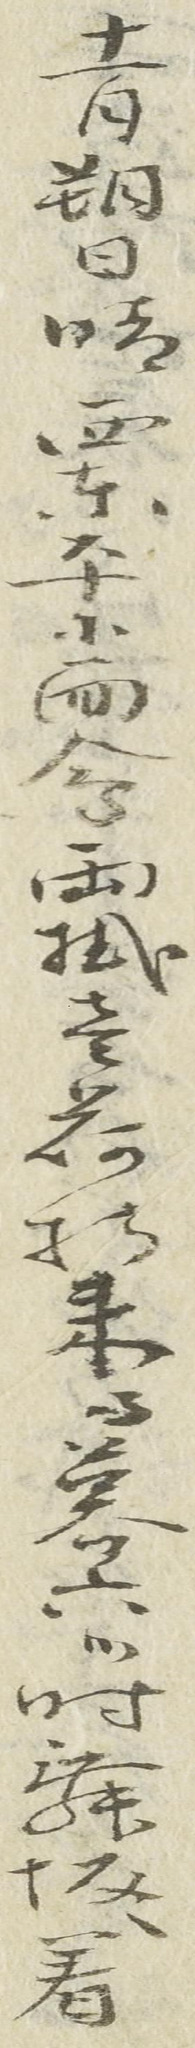十一月朔日晴西東平に面会両掛壱荷物来る暮六ツ時舞坂へ着
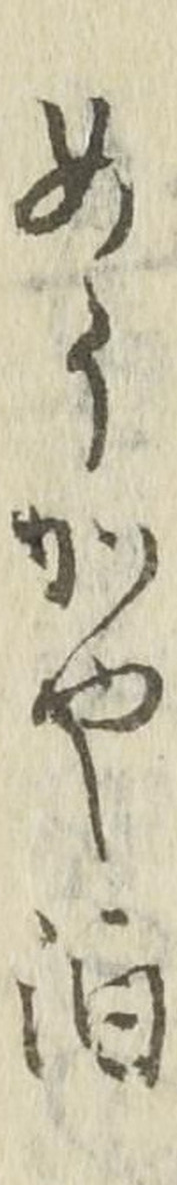めうかや泊
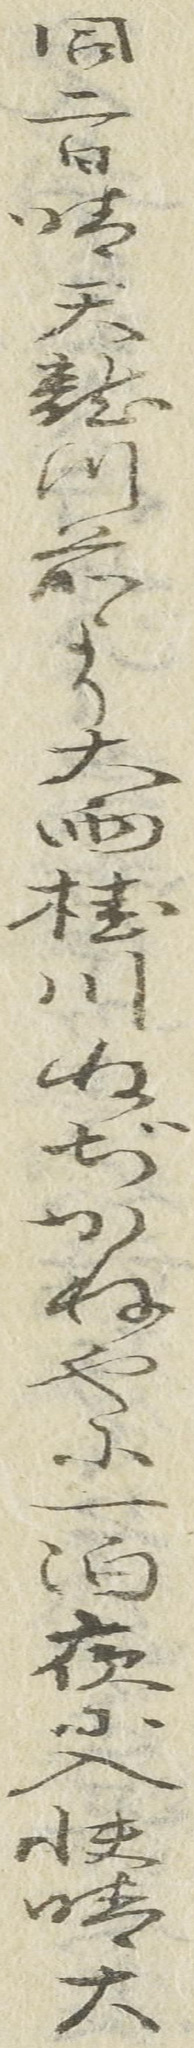同二日晴天龍川前より大雨桂川ねぢかねやに一泊夜に入快晴大
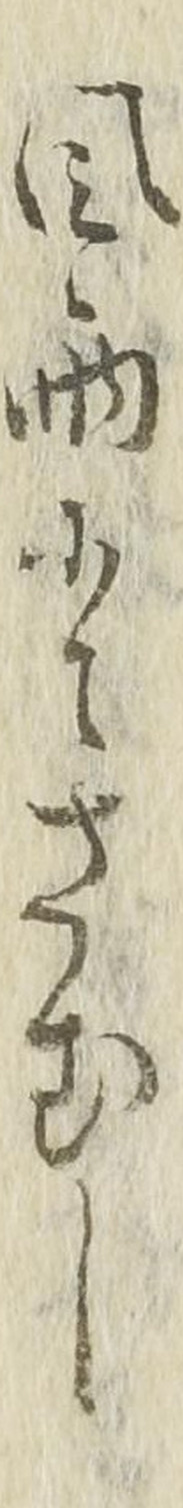風雨にてさむし
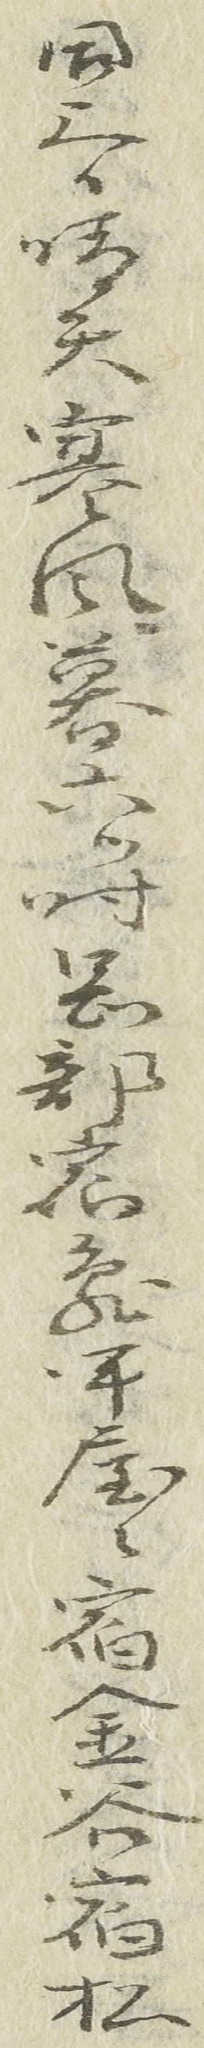同三日晴天寒風暮六ツ時岡部宿亀甲屋二宿金谷宿松
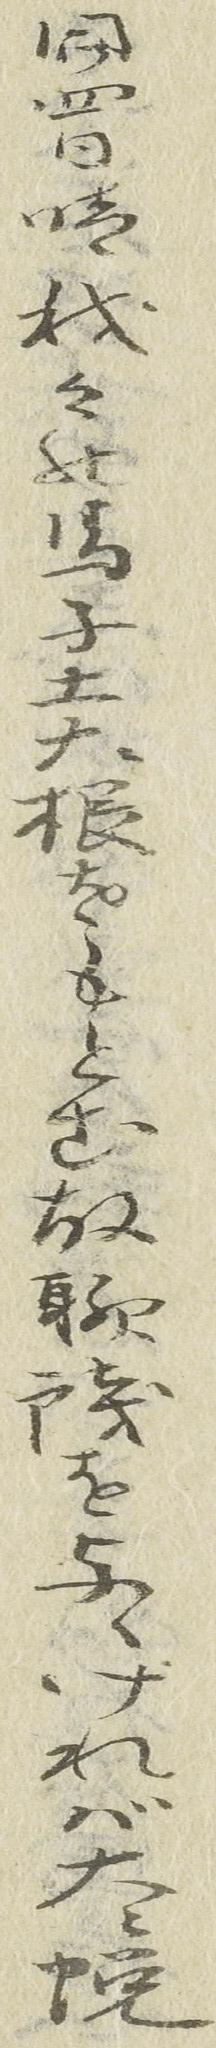同四日晴村々の馬子土大根をもとむ故聊銭を与へければ大に悦
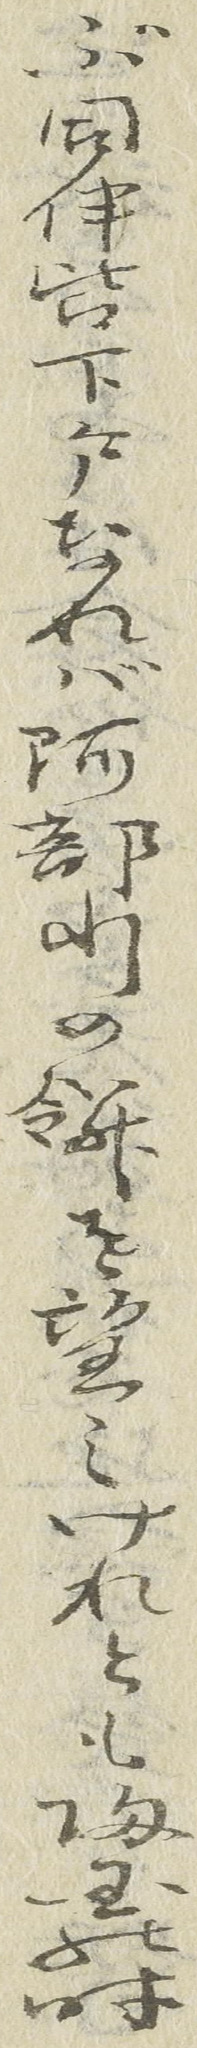ぶ同伴皆下戸なれバ阿部川の餅を望みけれとも帰国の時
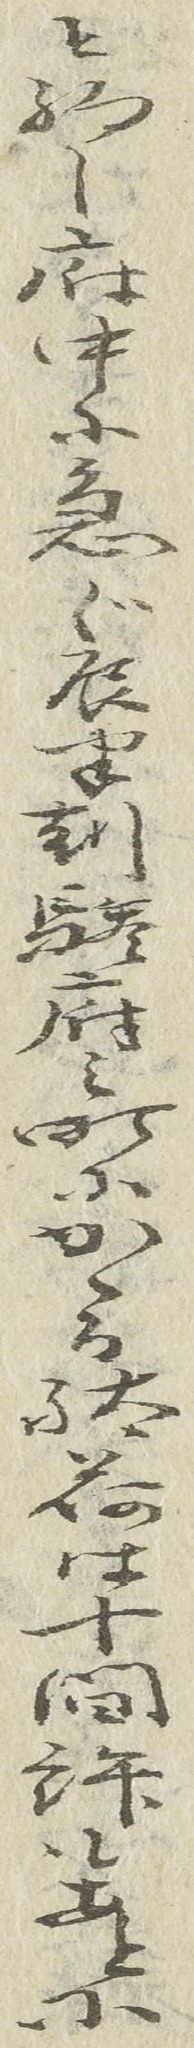と約し府中に急ぐ辰半刻駿府之町にかゝる駄荷は十間許もあとに
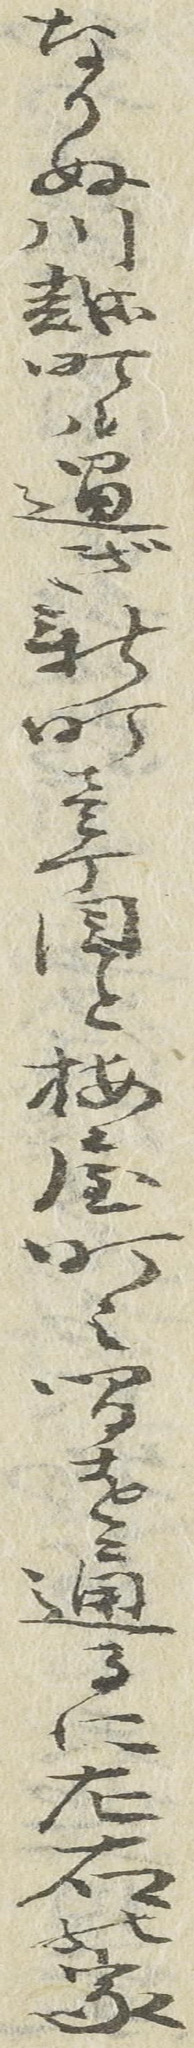なりぬ川越町も過ぎ新町壱丁目と梅屋町之間を通るに左右の家
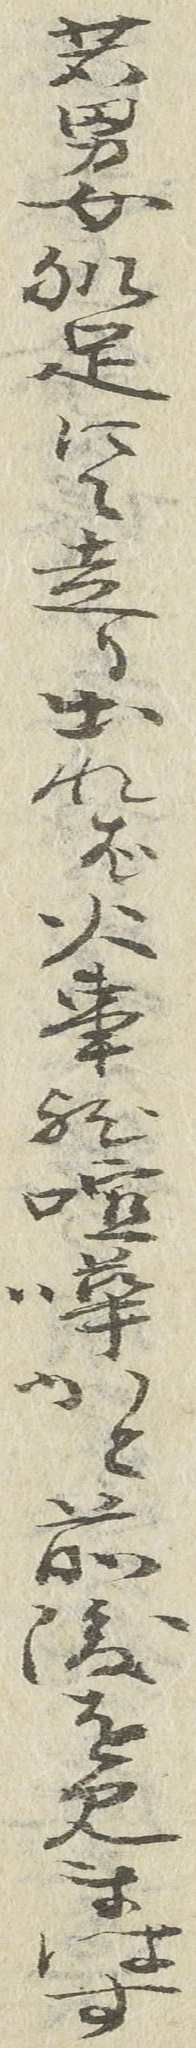若男女肌足にて走り出れば火事や喧嘩かと前後を見まはす
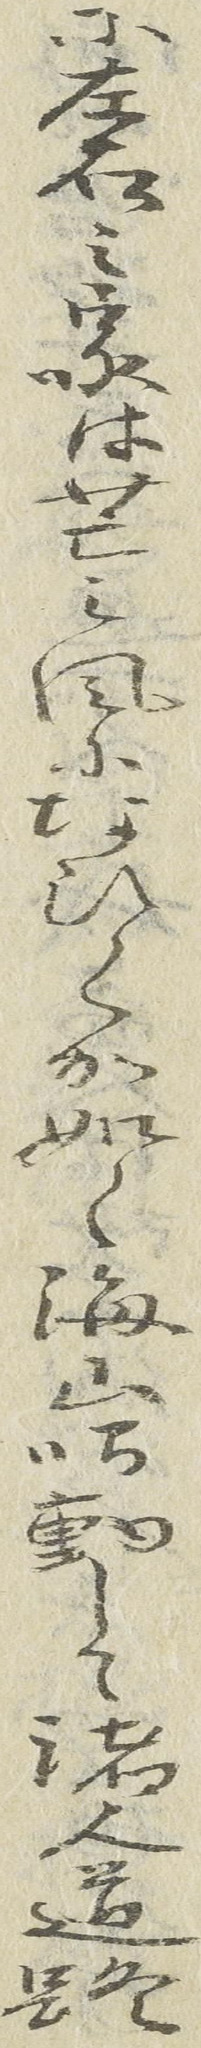に左右之家は芒之風になひくが如し海山鳴動して諸人道路に

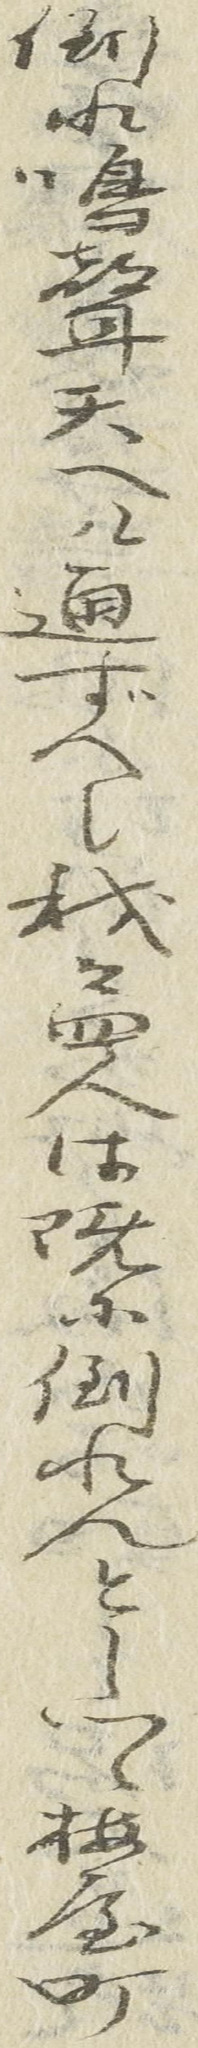倒れ鳴聲天へも通ずへし我々四人は既に倒れんとして梅屋町
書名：地震前兆集　全
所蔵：東京大学地震研究所図書室 Earthquake Research Institute Library, The University of Tokyo, JAPAN
